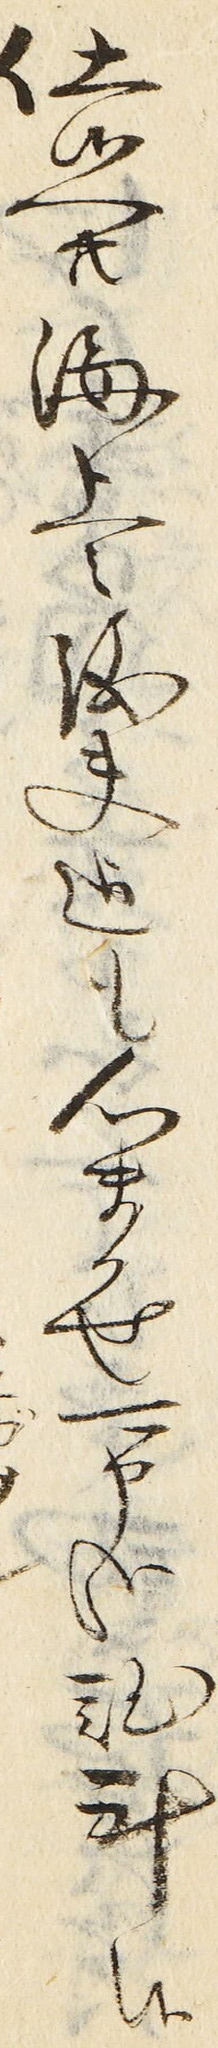仕候へ共海上之儀夫迄も心まかせ可申哉難計候
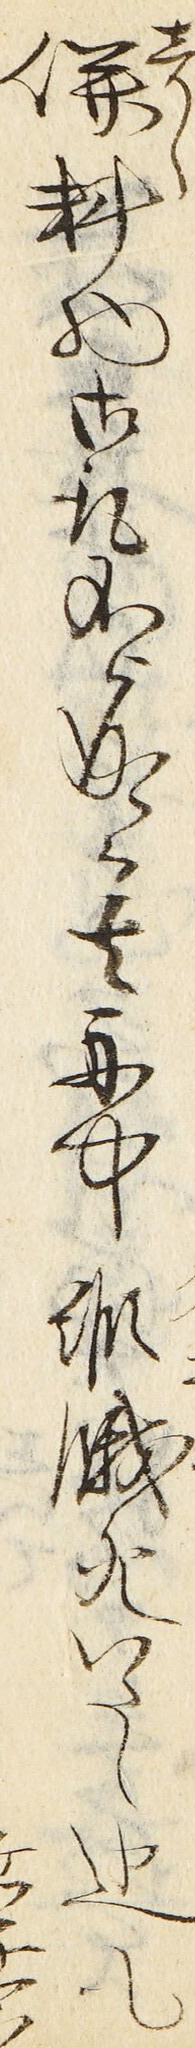併料物御取不被成候ては舟中縦餓死いたし迚も
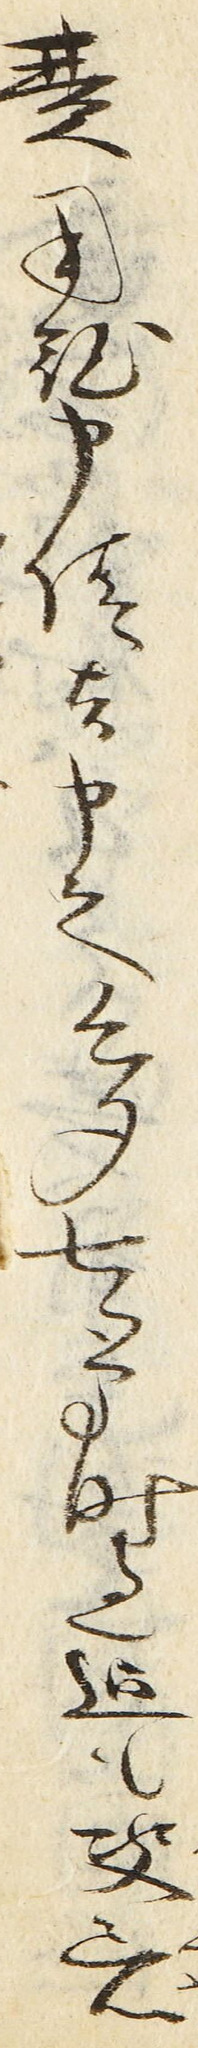費用難申請旨申之今夕七ッ時半時過迄も決着
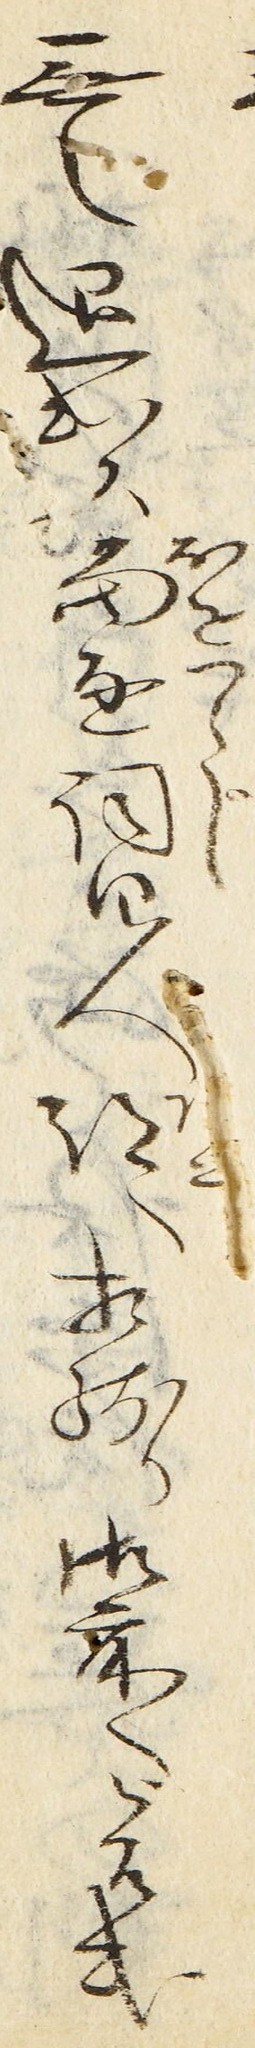無之退出す猶通詞四人跡へ相残り御前へ被召出

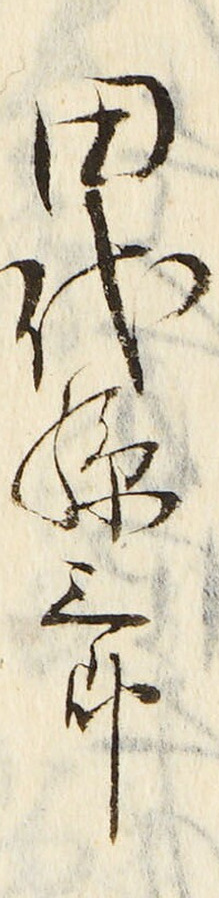〃田代孫三郎〃
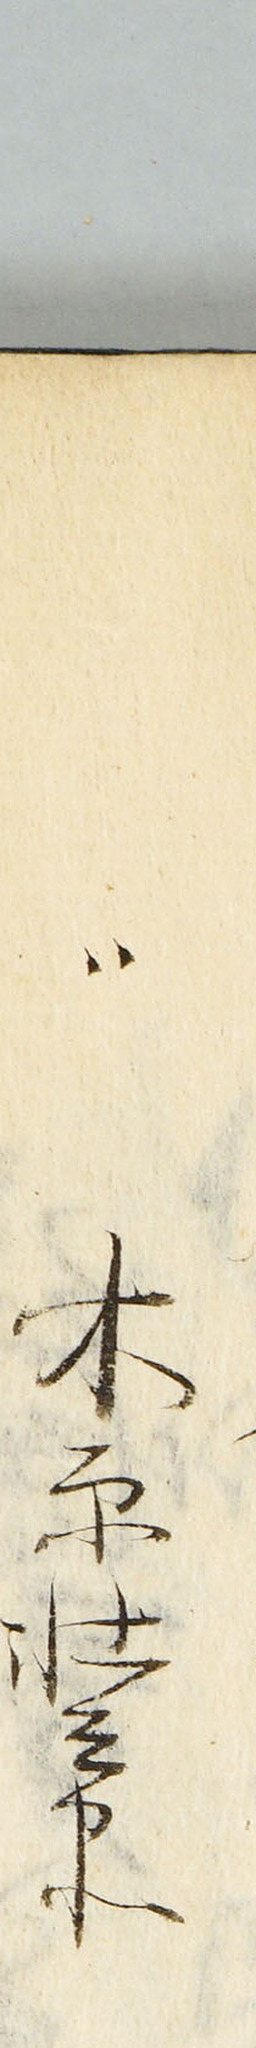〃木原壮兵衛〃
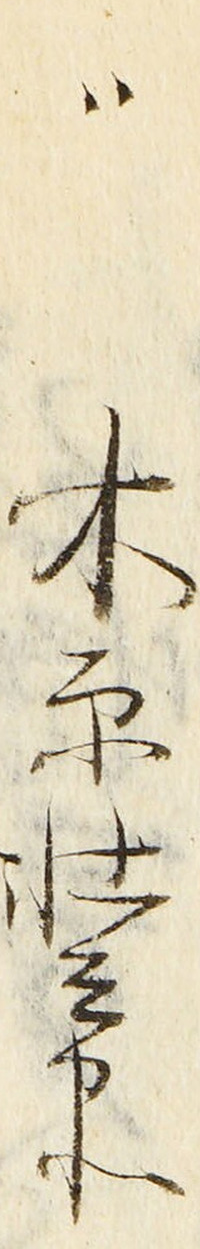〃木原壮兵衛〃

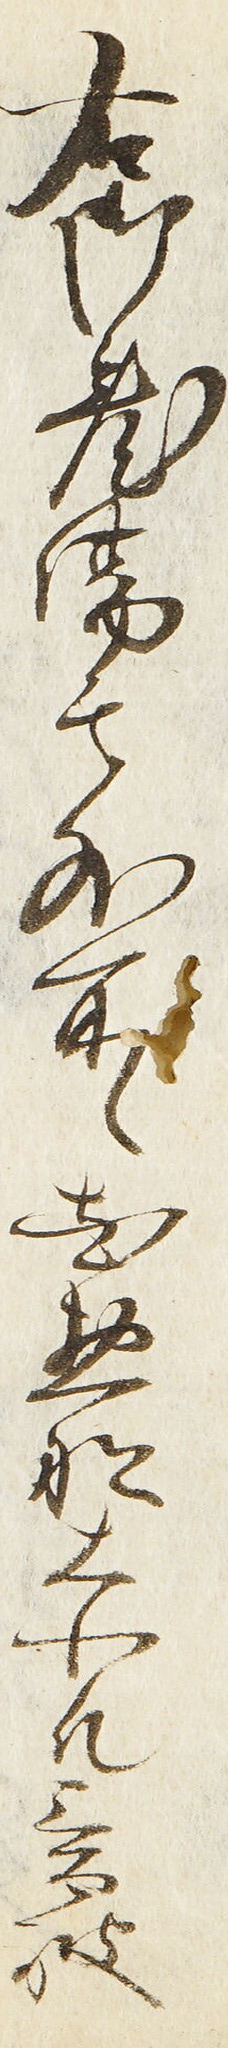右御台場其外所々固惣船大小凡三百艘
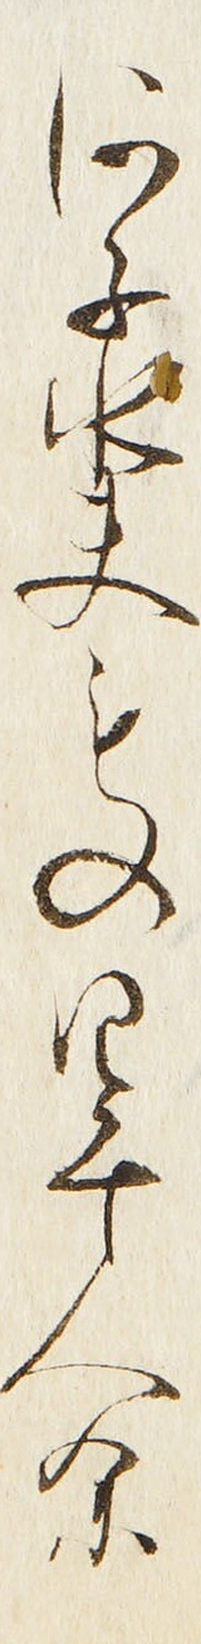阿子水夫もの四千人余
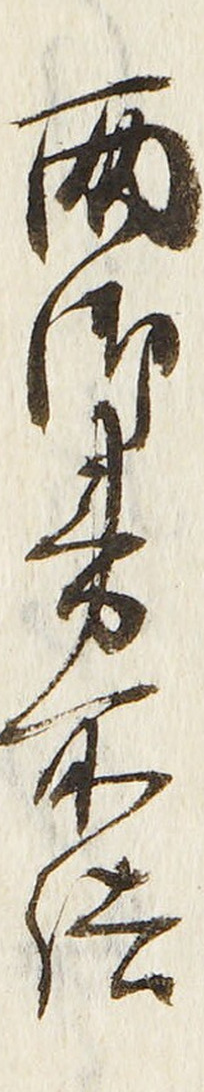両御番所詰
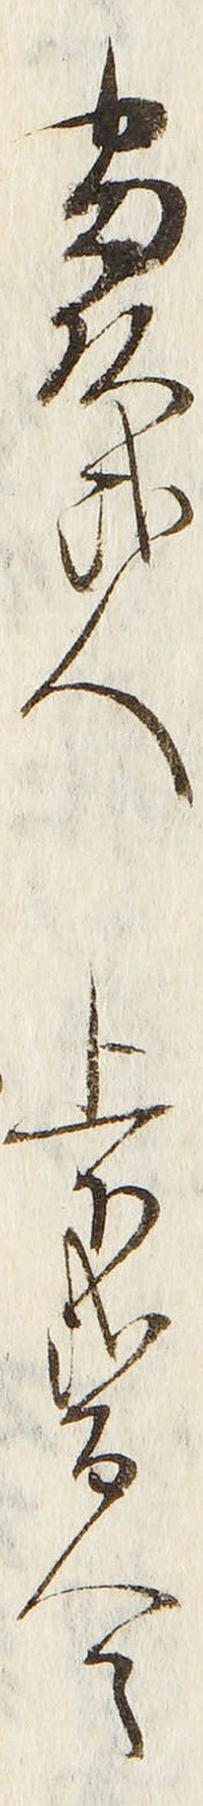番頭弐人上下二百人つゝ
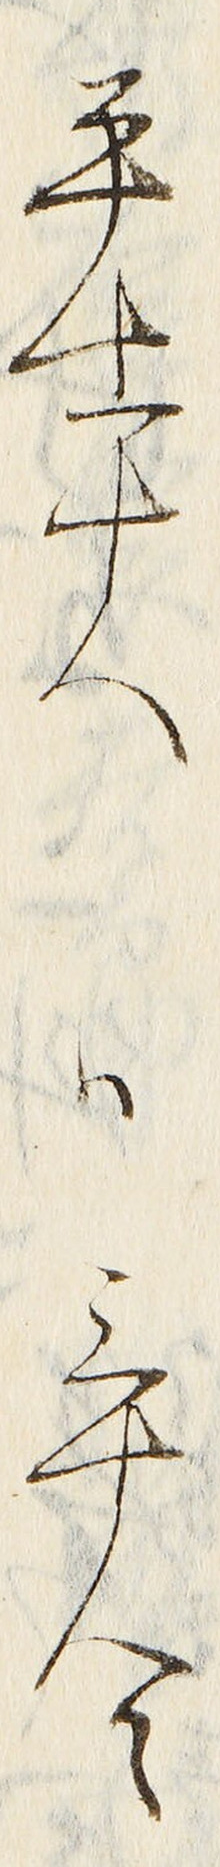平士十人〃三十人つゝ
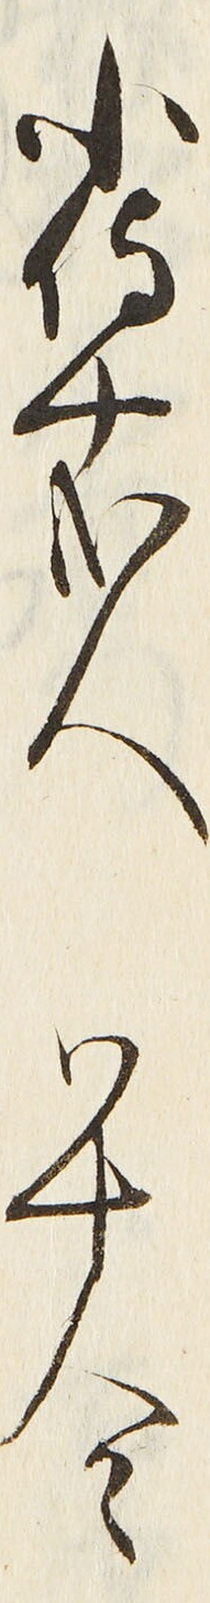小侍十弐人〃十人つゝ
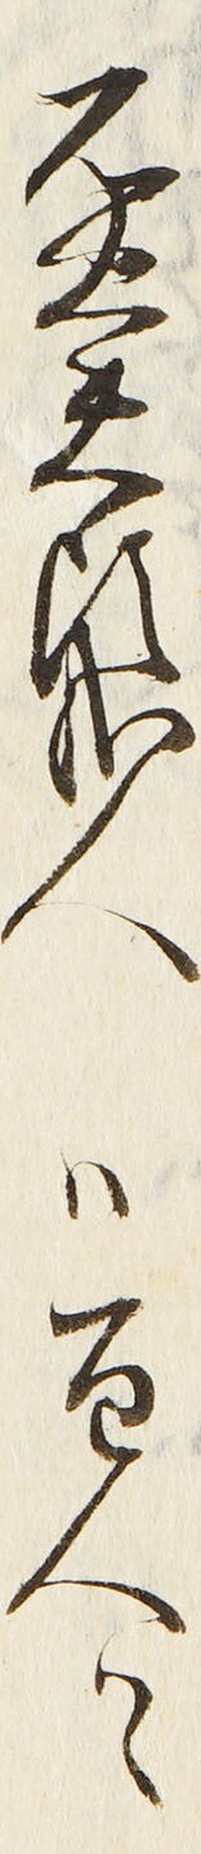石火矢頭弐人〃百人つゝ
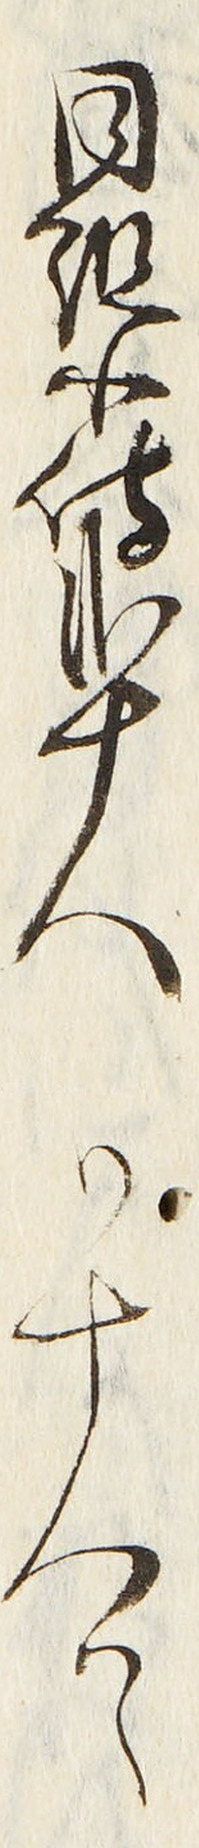同組小侍弐十人〃十人つゝ
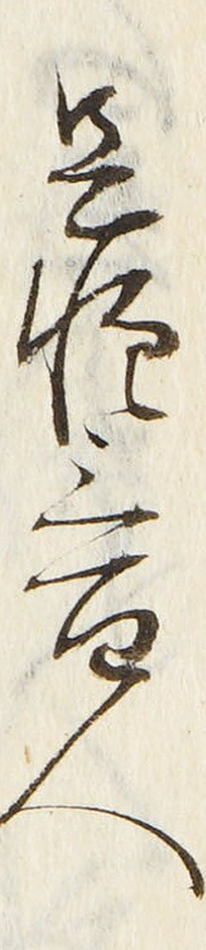足軽三百人
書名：魯西亜国舟渡来始末并日本流漂人異国遍歴之話（西洋欧羅巴州之内一）
